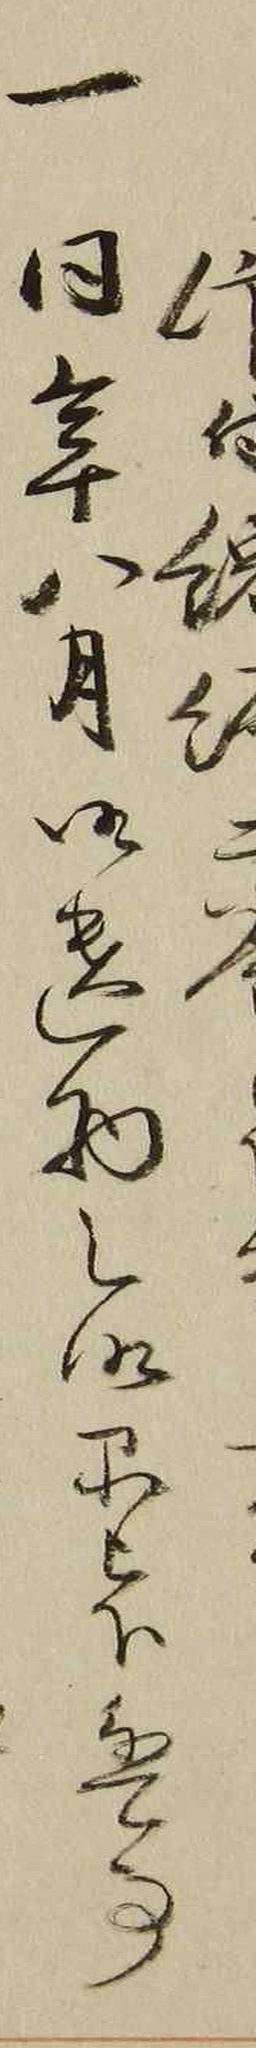一同年八月御遺物之御品被下置候事
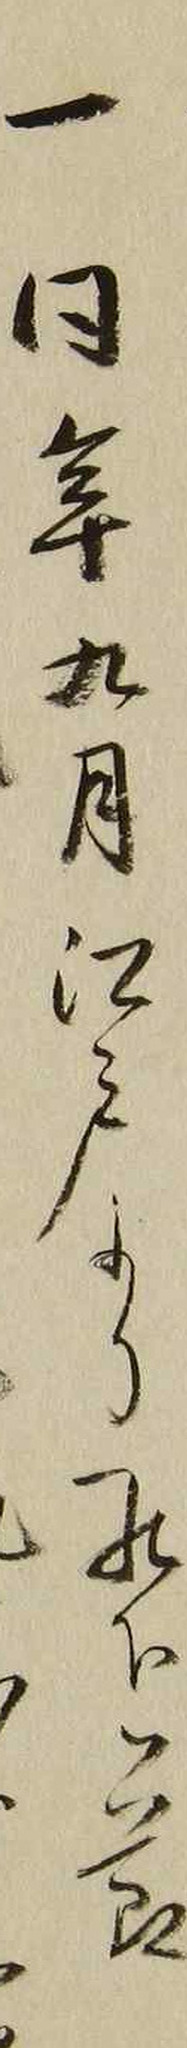一同年九月江戸より罷下候節
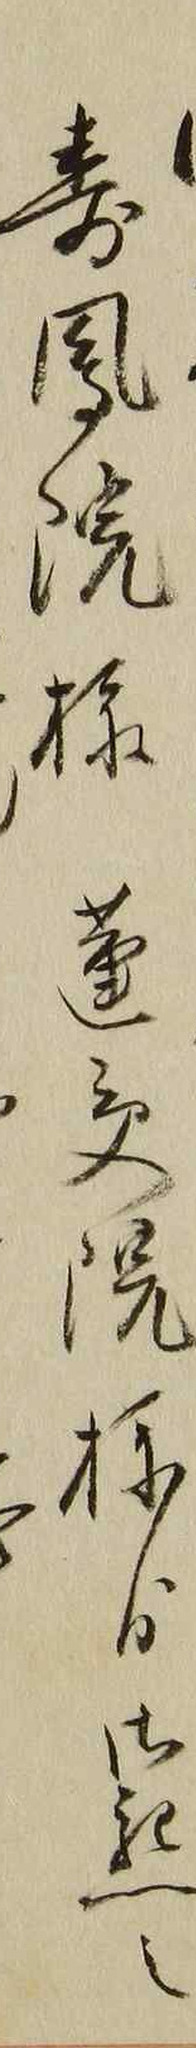寿鳳院様蓮受院様ゟ御懇之
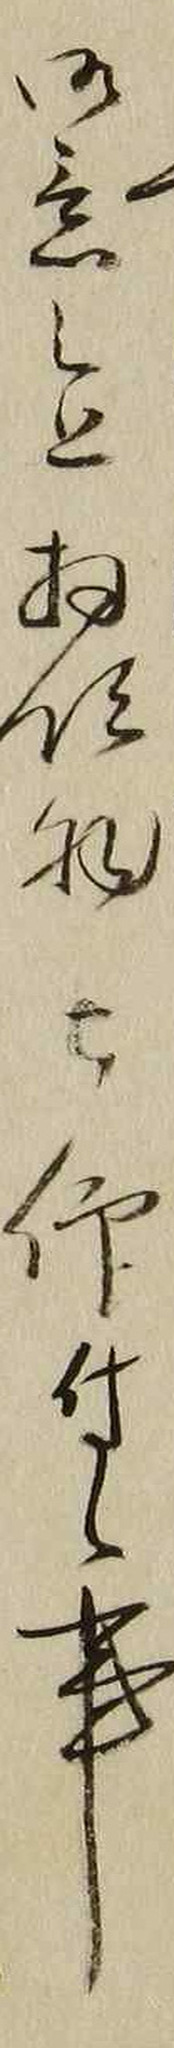御意之上拝領物被仰付候事
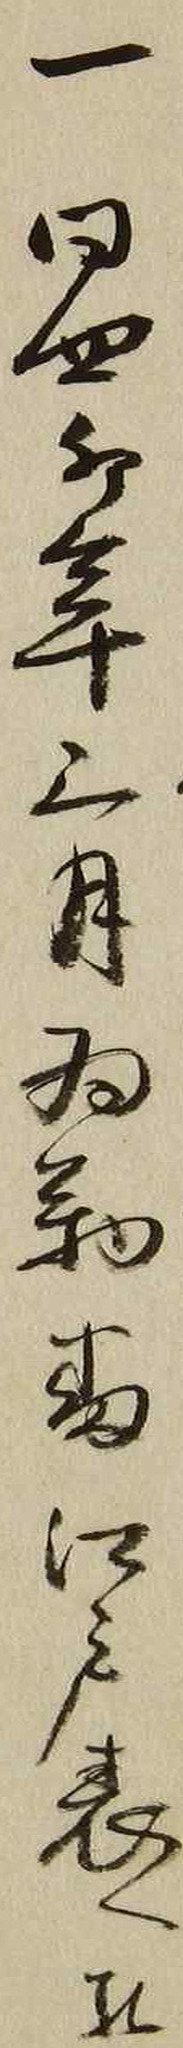一同四卯年三月為勤番江戸表へ罷
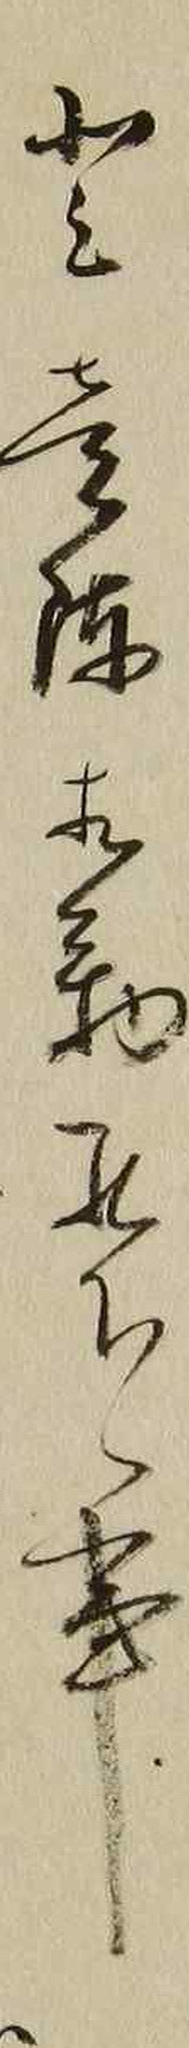登壱陣相勤罷下候事
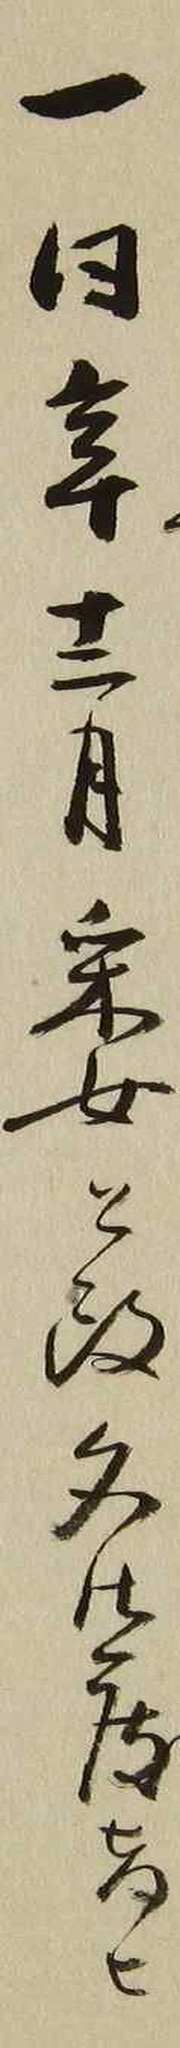一同年十二月采女と改名仕度旨被
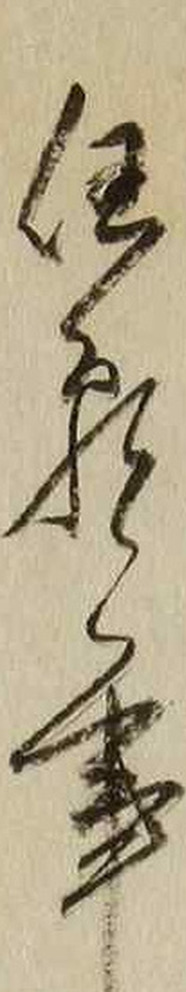任願候事
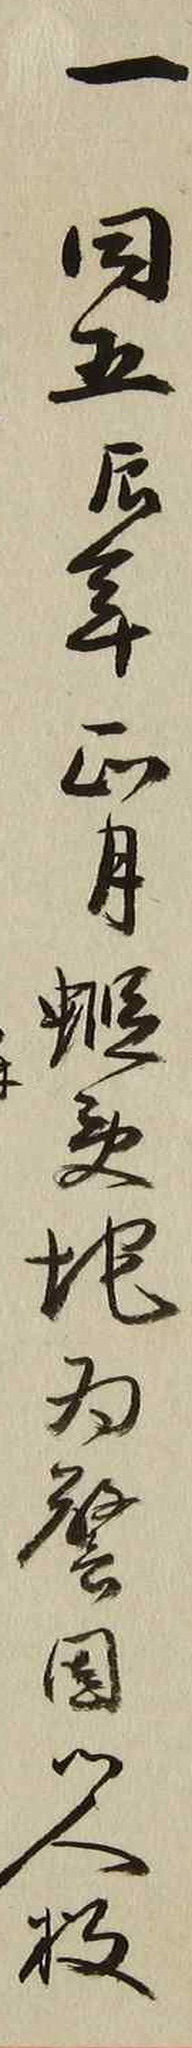一同五辰年正月蝦夷地為警固御人数
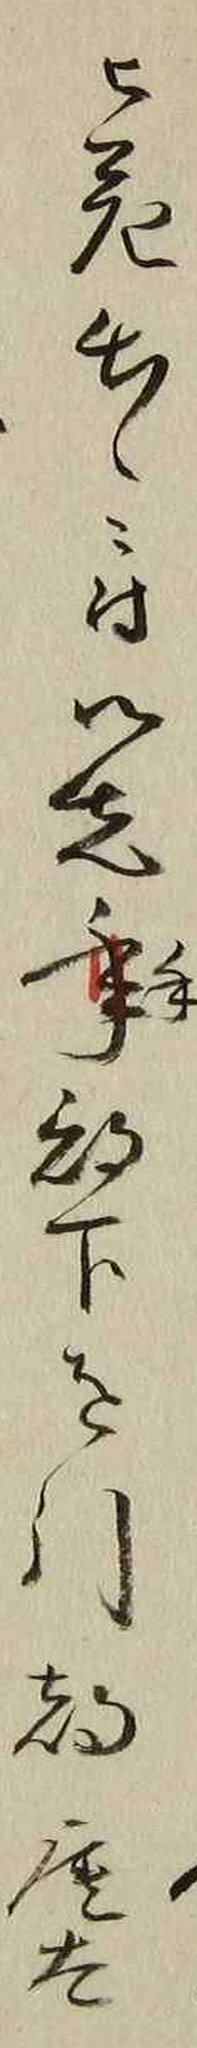被差出候に付御先手部下を引都唐太
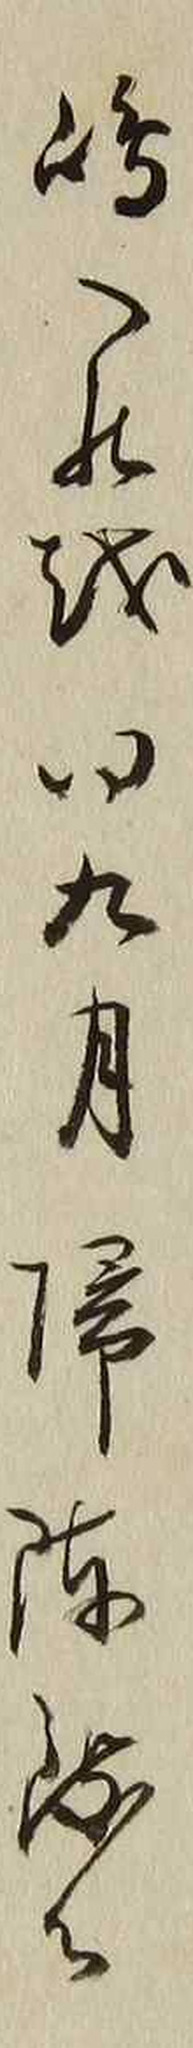嶋へ罷越同九月帰陣致候
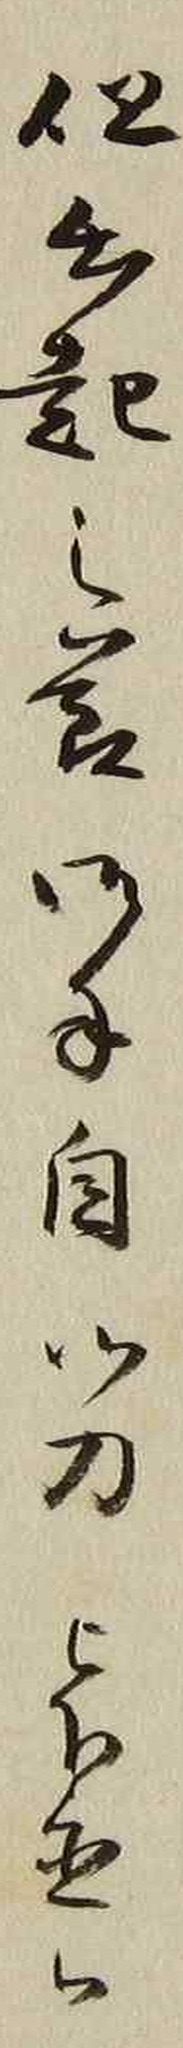但出起之節御手自御刀被下置候
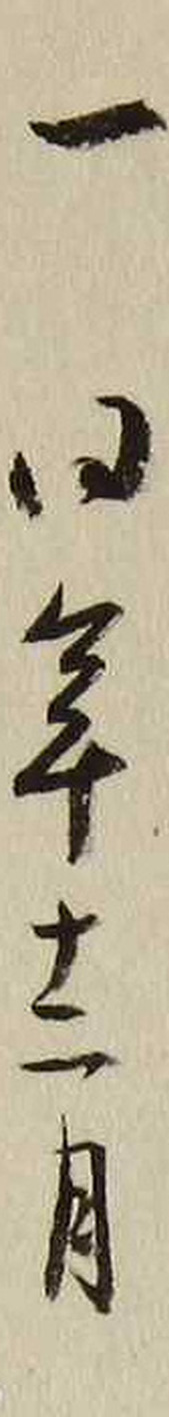一同年十二月
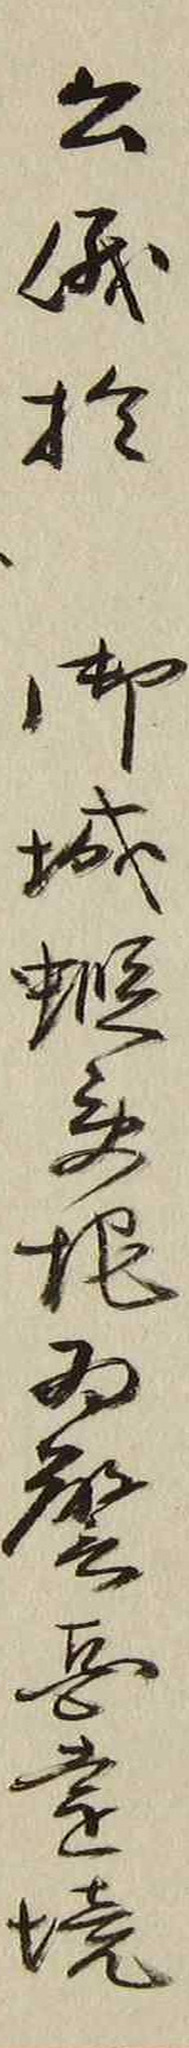公儀於御城蝦夷地為警固遠境
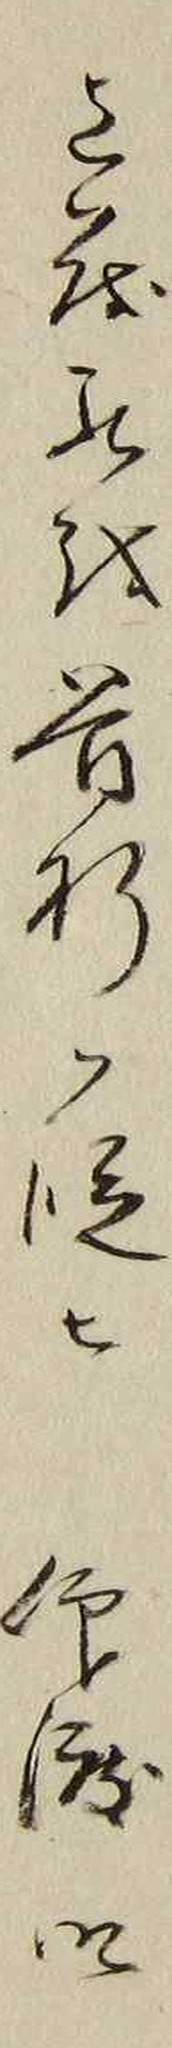迄も罷越骨折候段被仰渡御
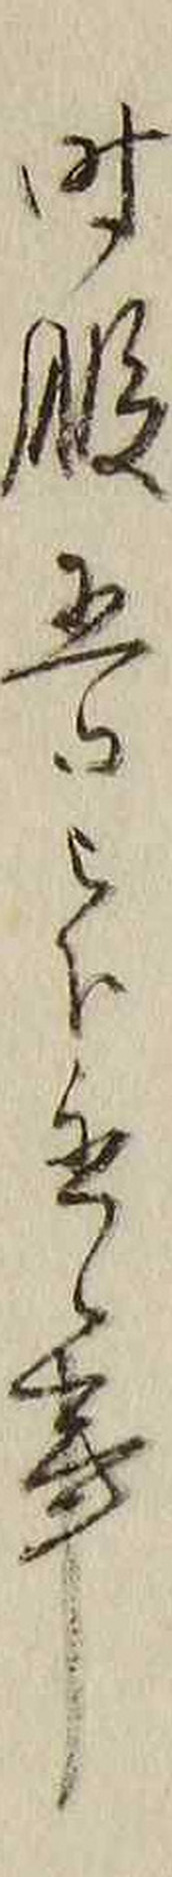時服五つ被下置候事
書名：諸士系譜　巻之292　き之部1
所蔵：会津若松市立会津図書館
